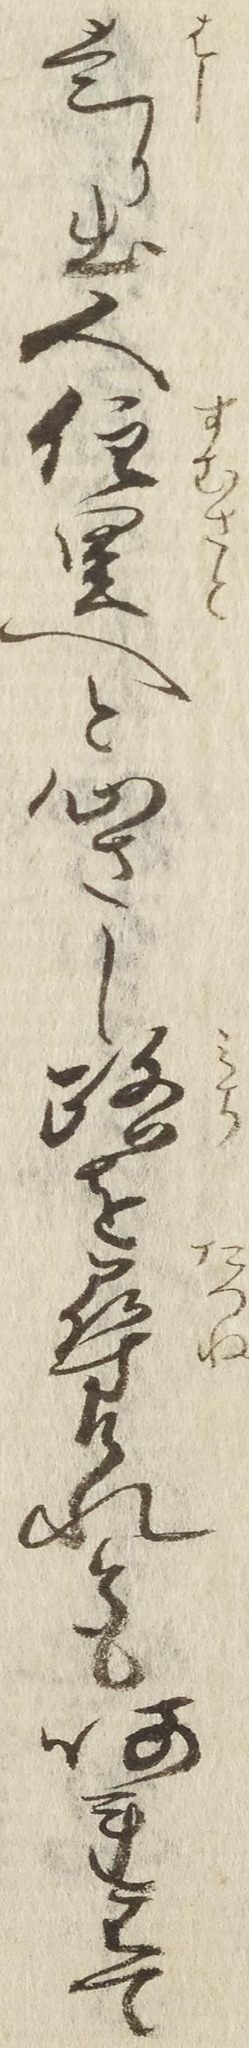走り出人住里へと心さし路を尋けれともあれはて
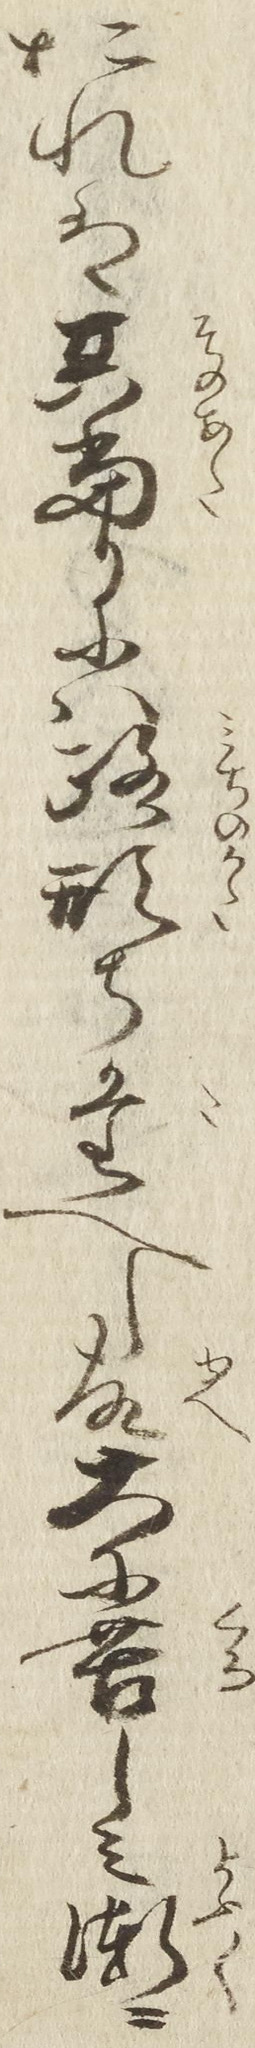たれは其当りには路形ち堂へし故大に苦しみ漸ニ
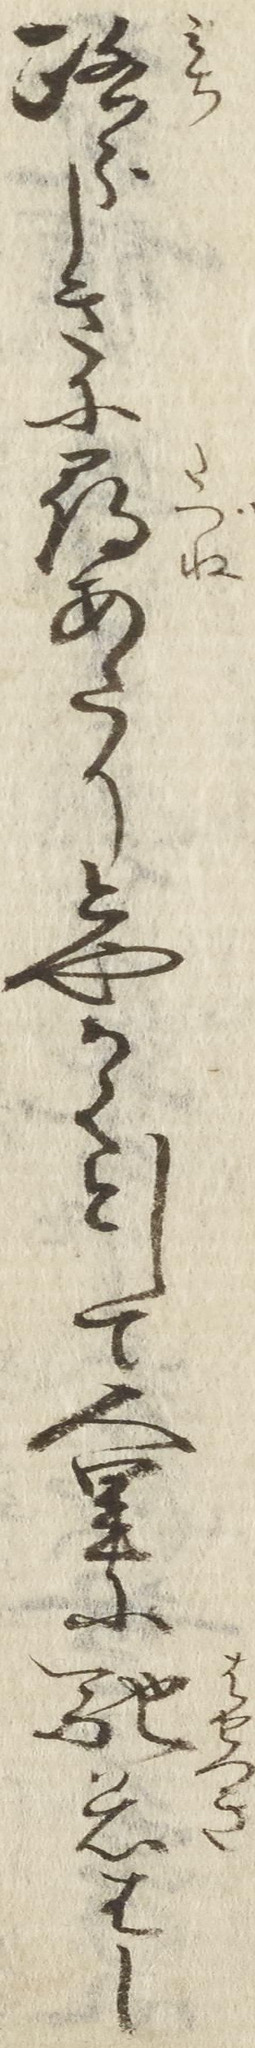路らしきに尋あたりとやかくとして人里に馳着はし
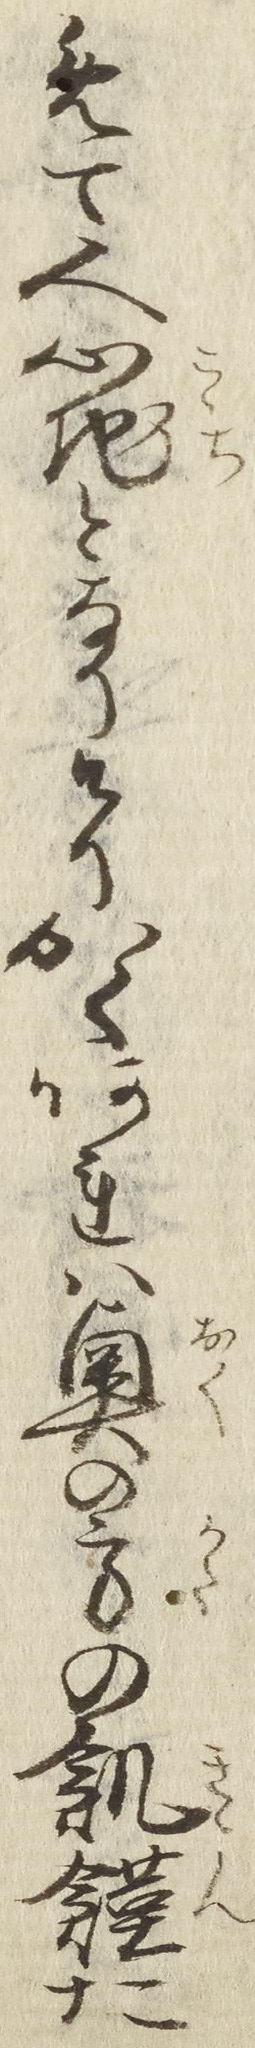めて人心地となりけりかくあれは奥の方の飢饉た
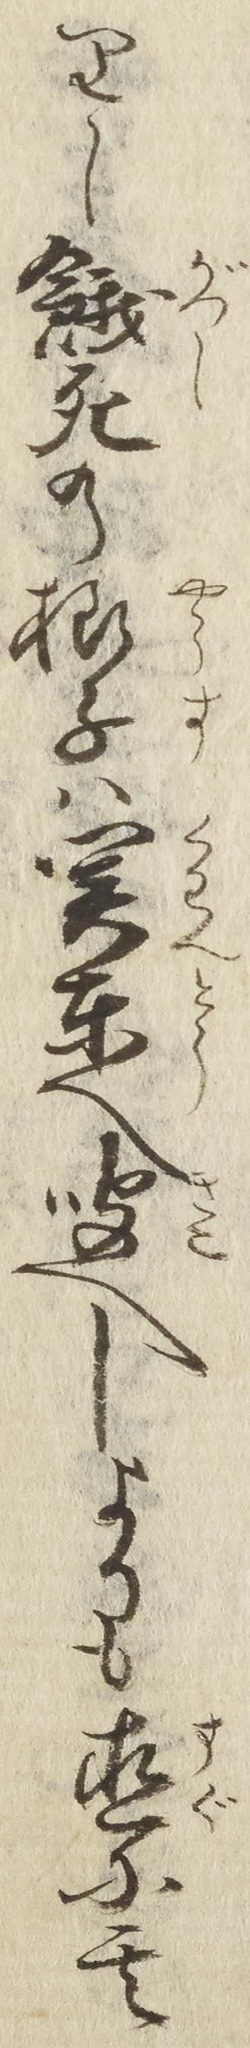りし餓死の様子は関東へ聞へしよりも直に其

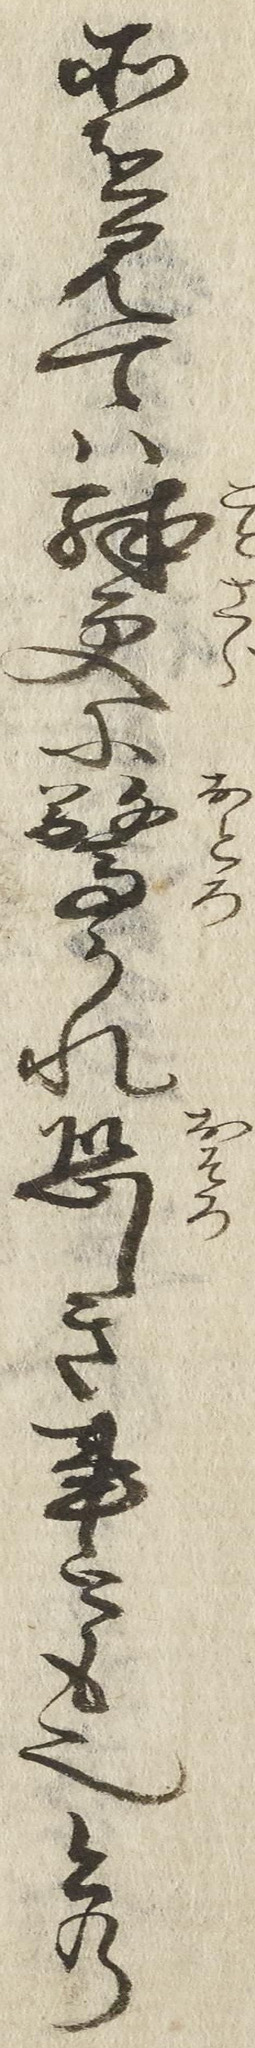所を見ては殊更に驚かれ恐しき事とも也との
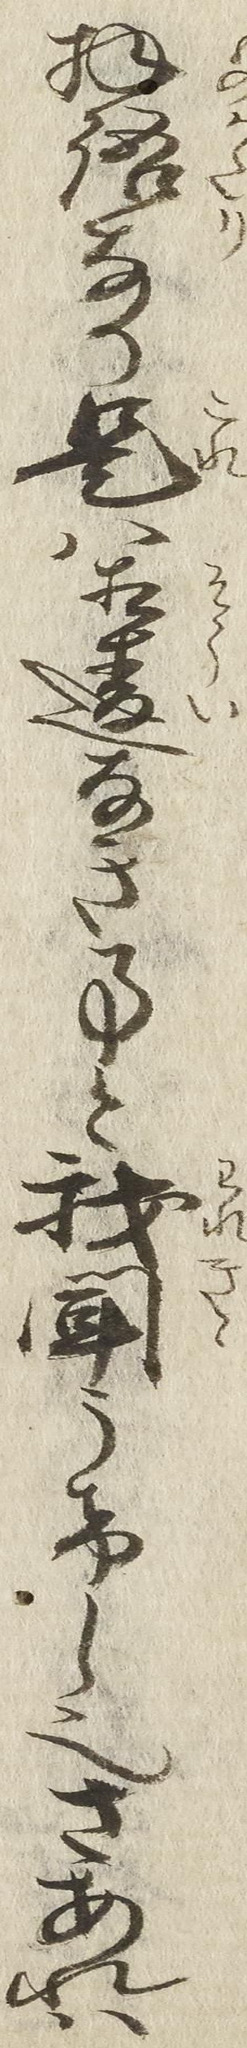物語なり是は相違なき事と我聞うけし也さあれは
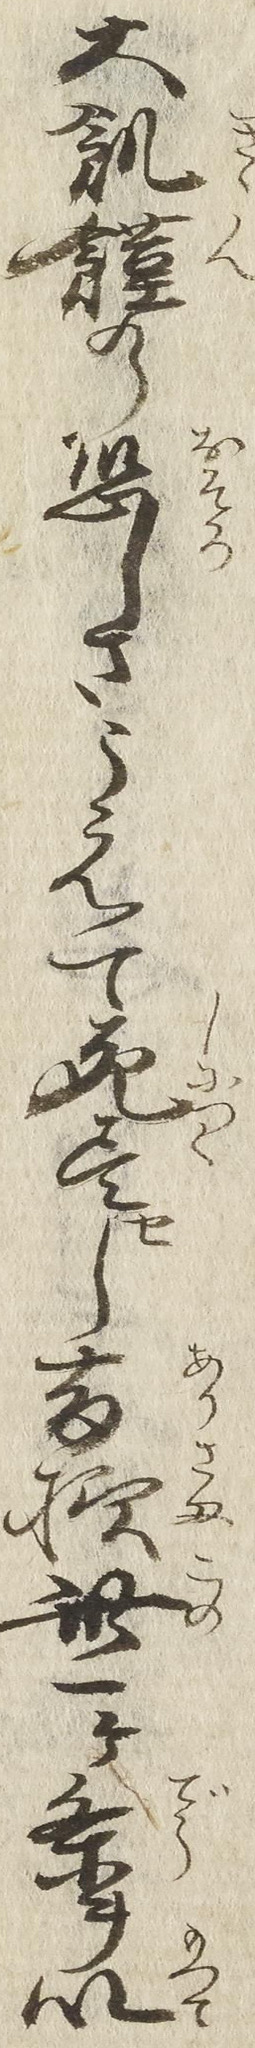大飢饉の恐しさうえて死尽せし有様此一ケ条ヲ以
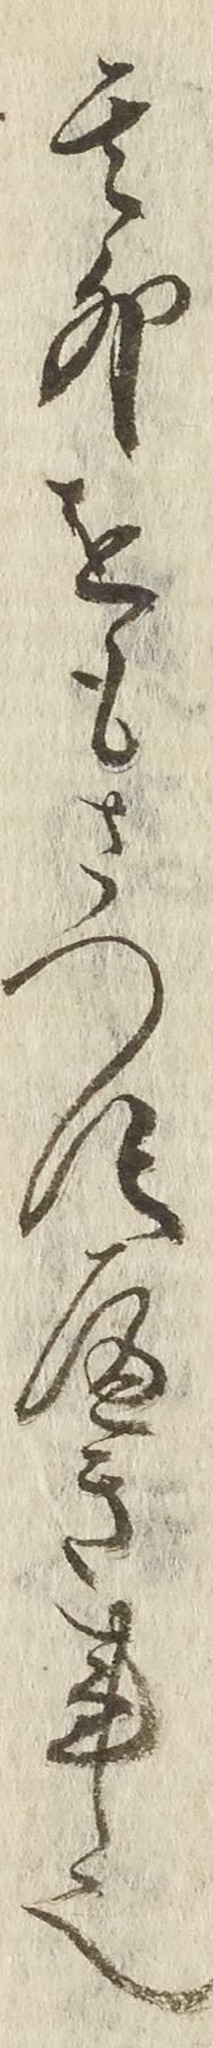其外をさつすへき事也
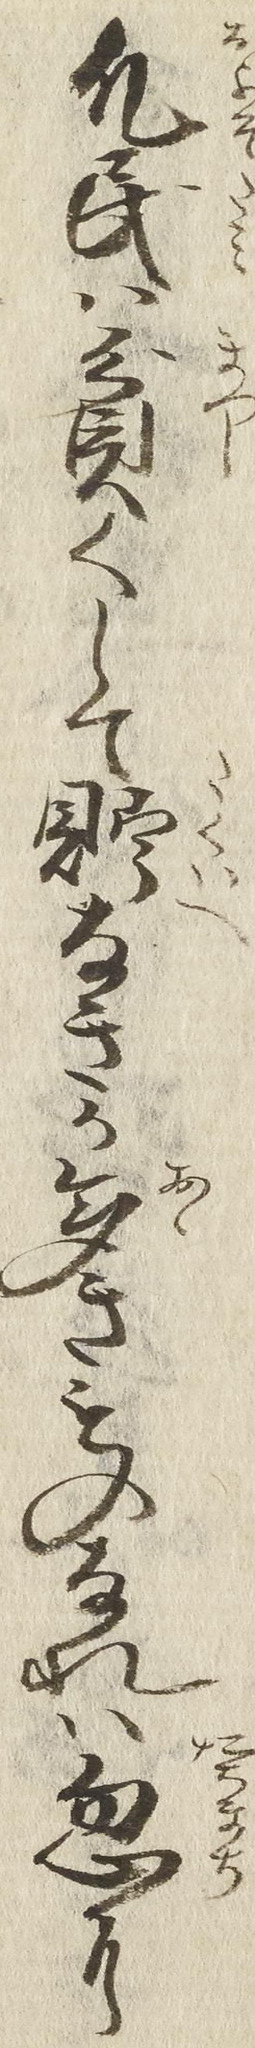凡民は貧くして貯なきか多きものなれは忽に
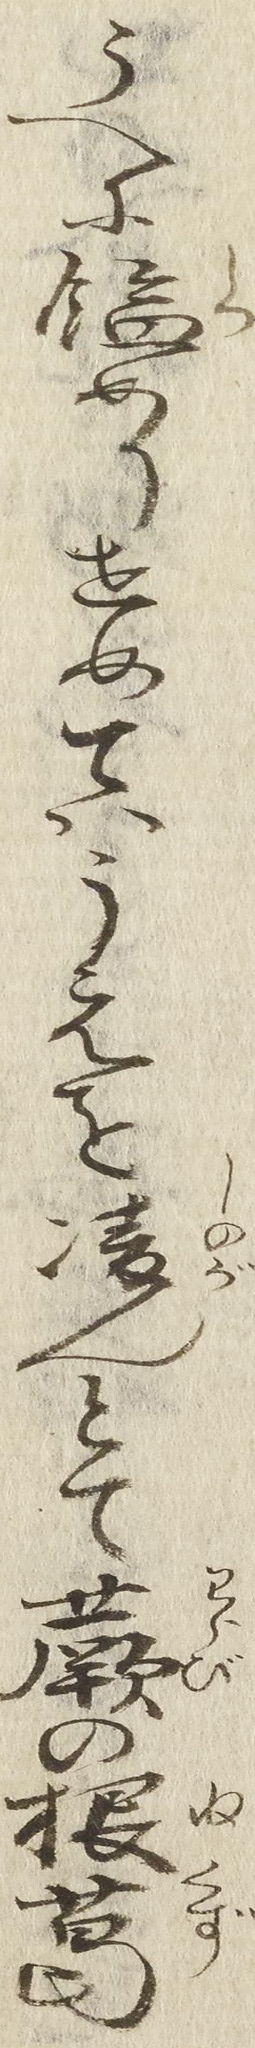うへに？めりせめてはうえを凌んとて蕨の根葛
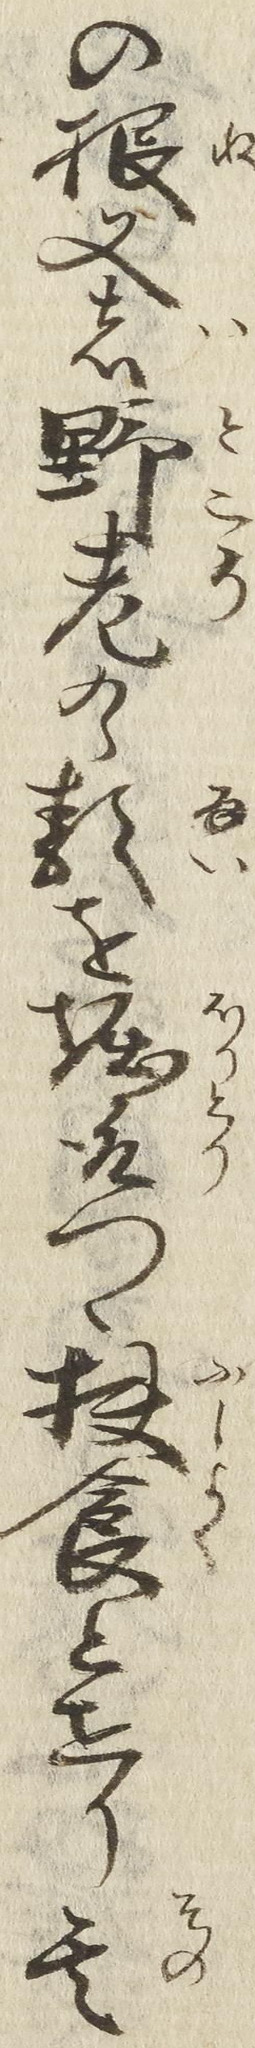の根又者野老の類を堀取つゝ扶食とせり其
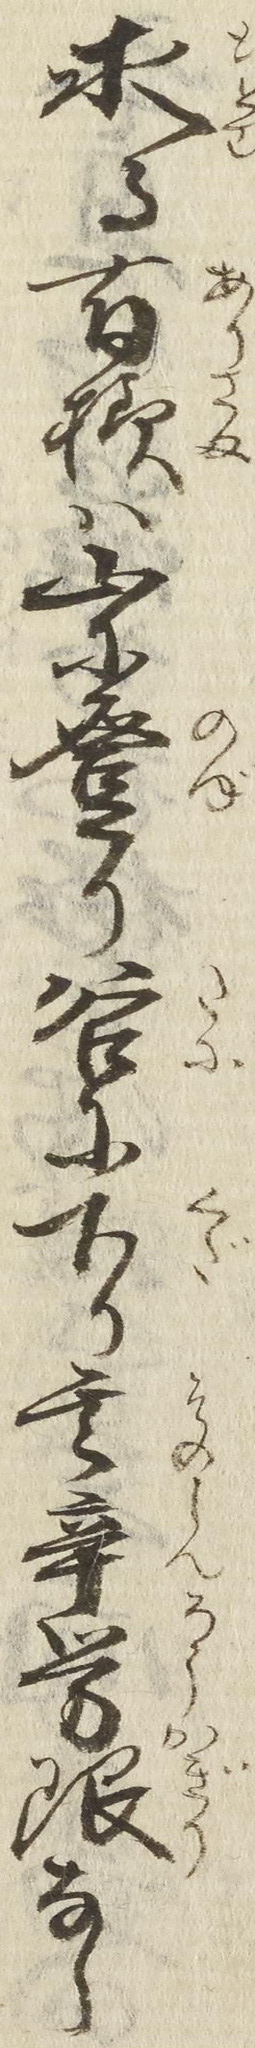求る有様は山に登り谷に下り其辛労限なし
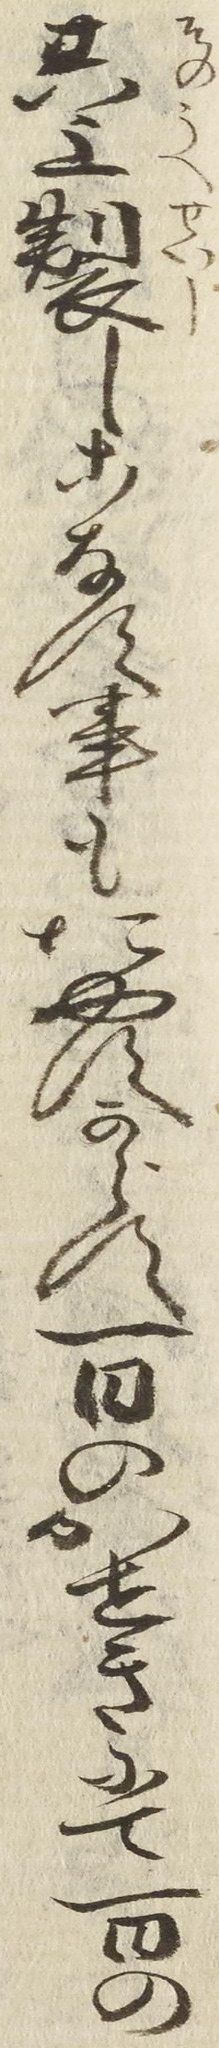其上製しこなす事もたやすからす一日のかせきにて一日の
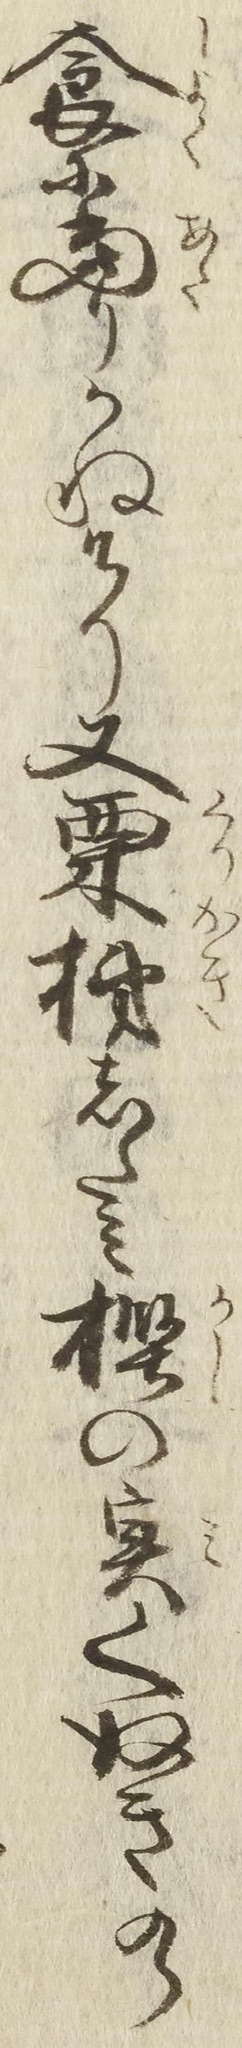食に当りかねけり又栗柿したみ樫の実くぬきの
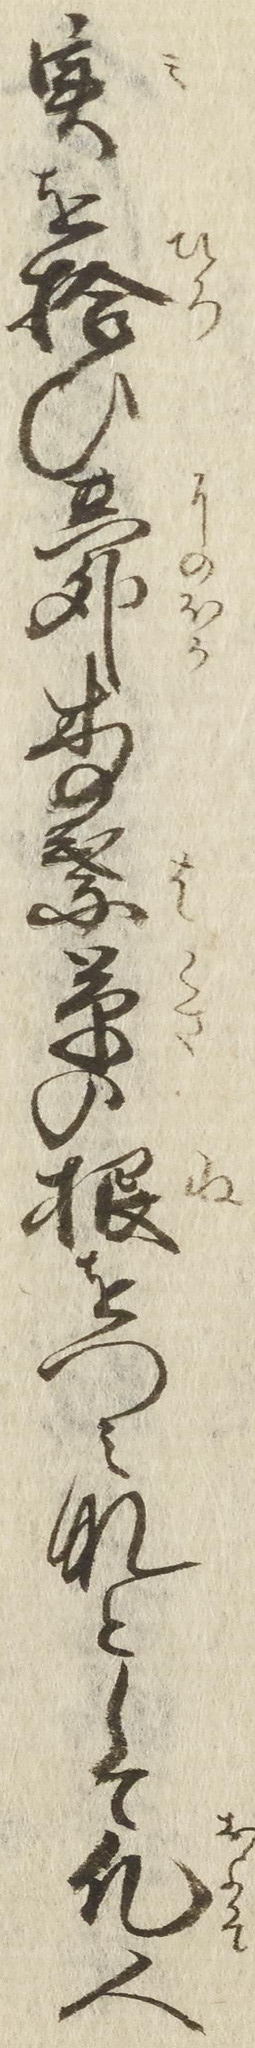実を拾ひ其外木の葉草の根をつみれとして凡人
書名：天明奇畧　全
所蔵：東京大学地震研究所図書室 Earthquake Research Institute Library, The University of Tokyo, JAPAN
